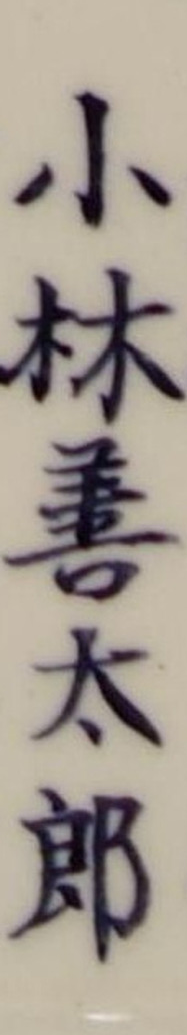小林善太郎
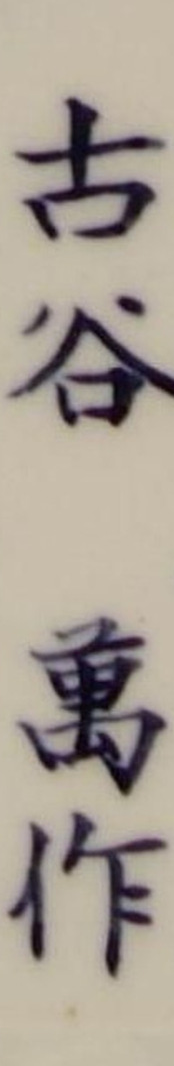古谷万作
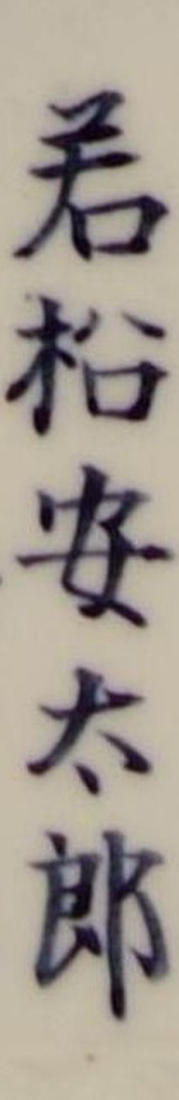若松安太郎
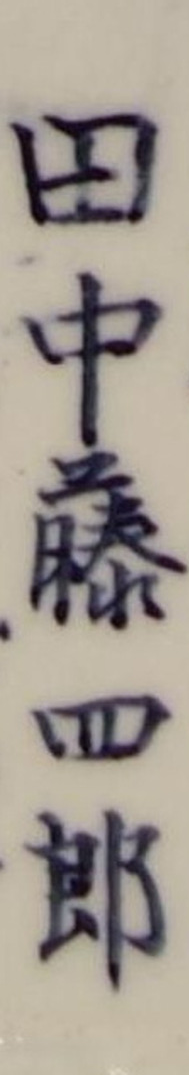田中藤四郎
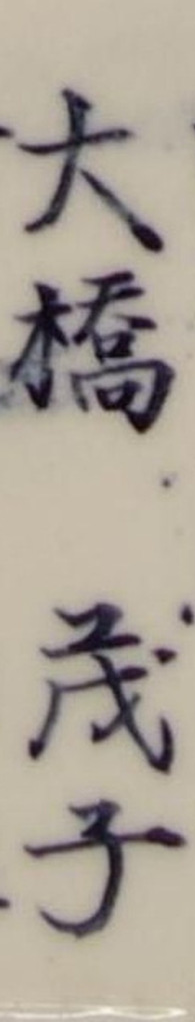大橋茂子
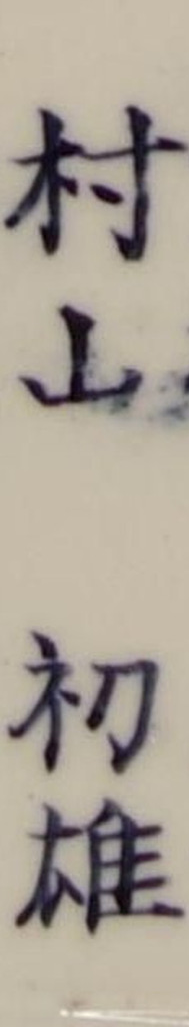村山初雄
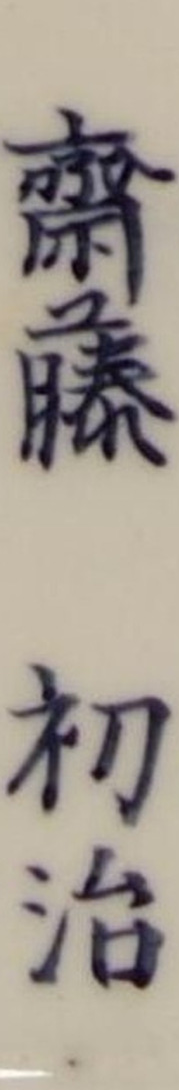齋藤初治
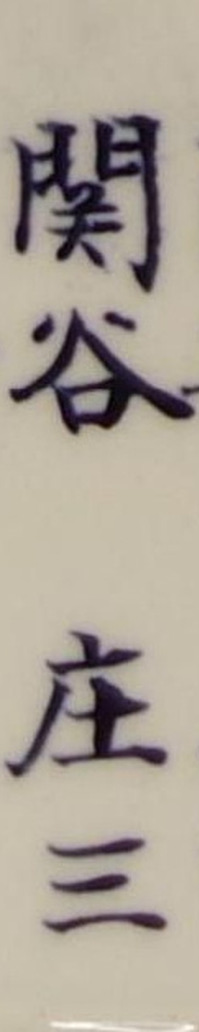関谷庄三
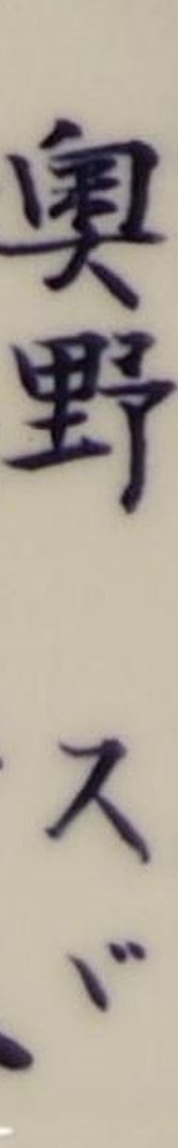奥野スヾ
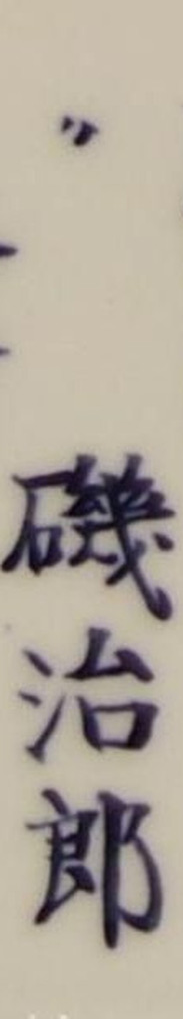磯治郎
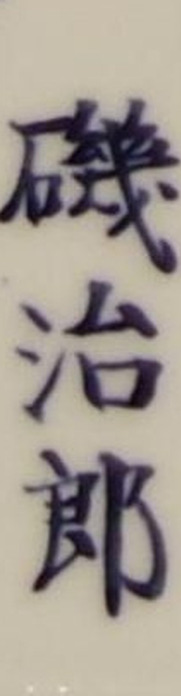磯治郎
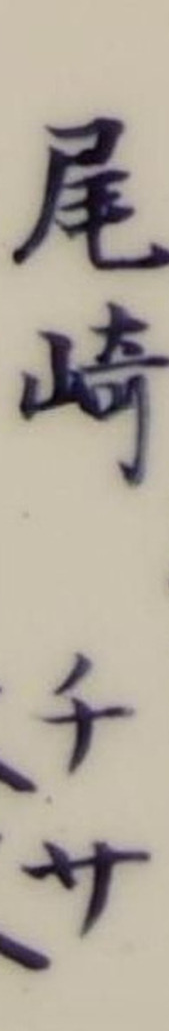尾崎チサ

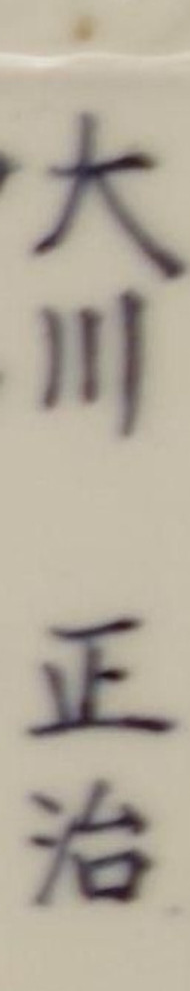大川正治
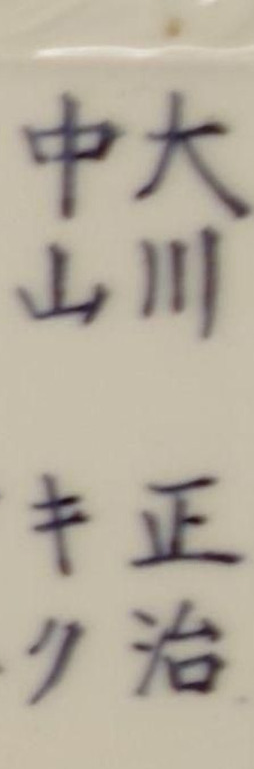中山キク
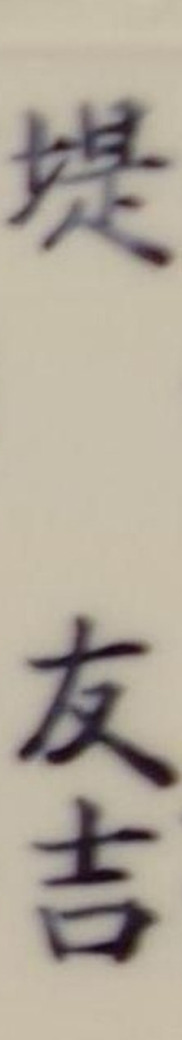堤友吉
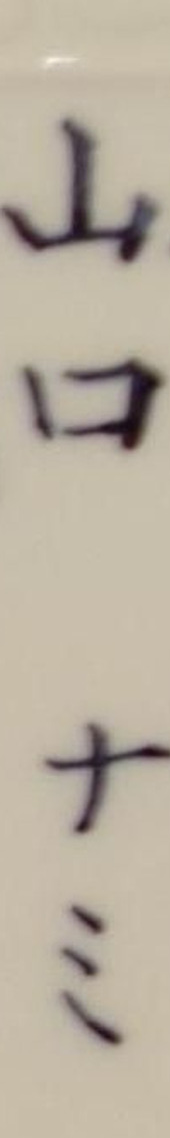山口ナミ
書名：M~S
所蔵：高野山金剛峯寺
